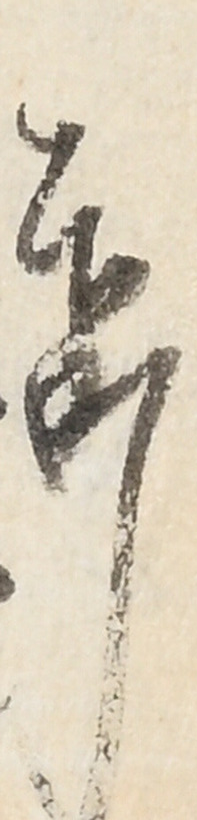十一月
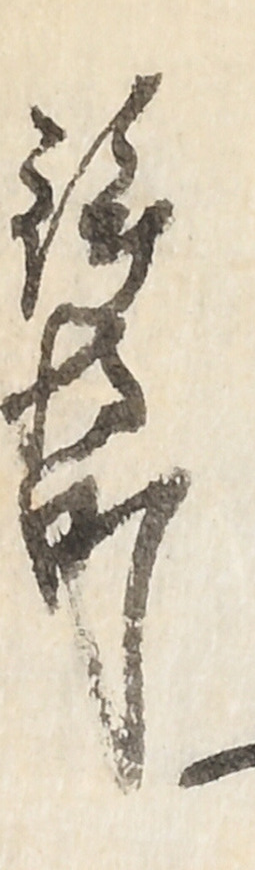鉾持町

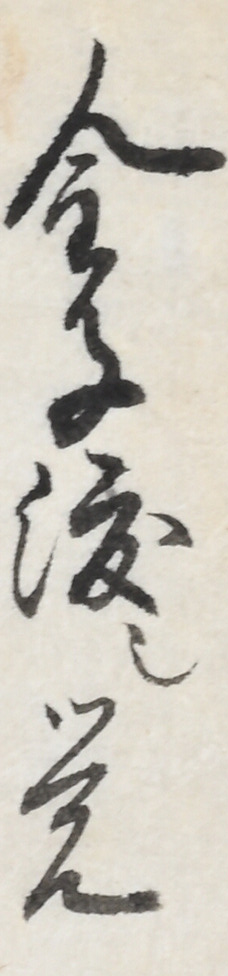金子渡し覚
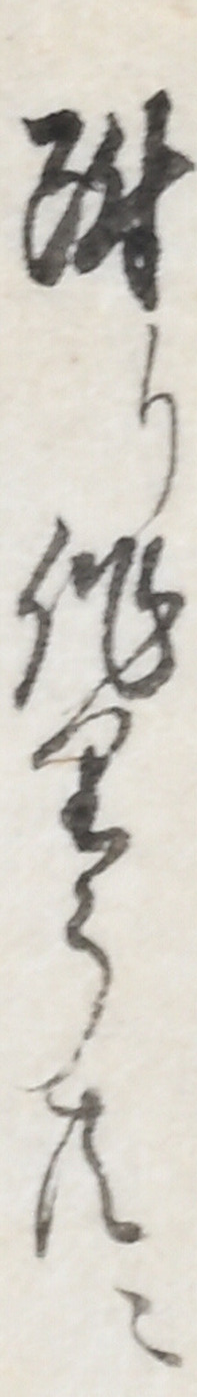附り作りう共に
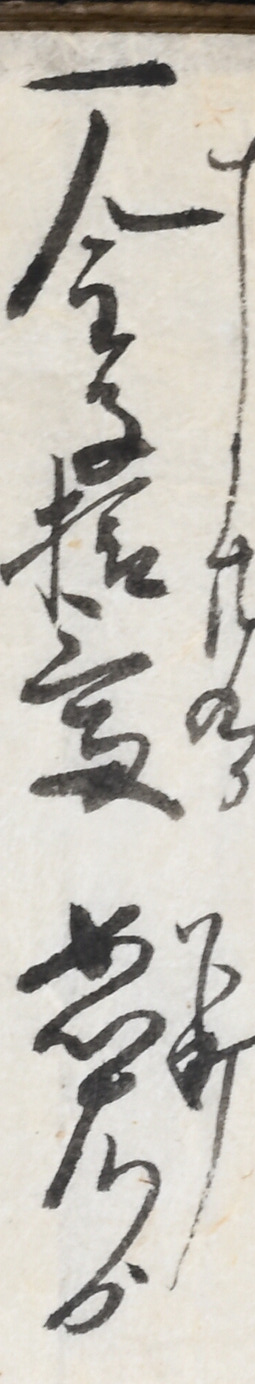一金子拾三両惣右衛門
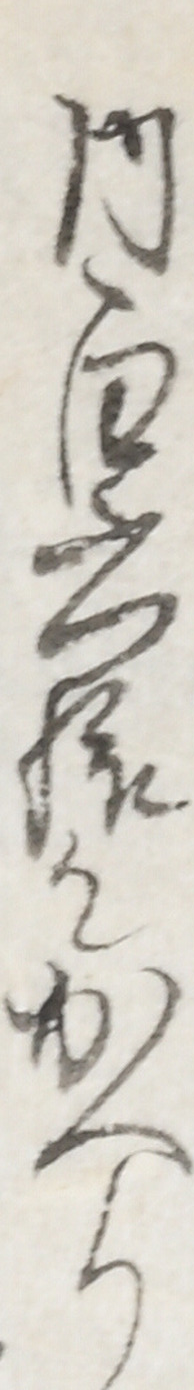内百六拾文かへり
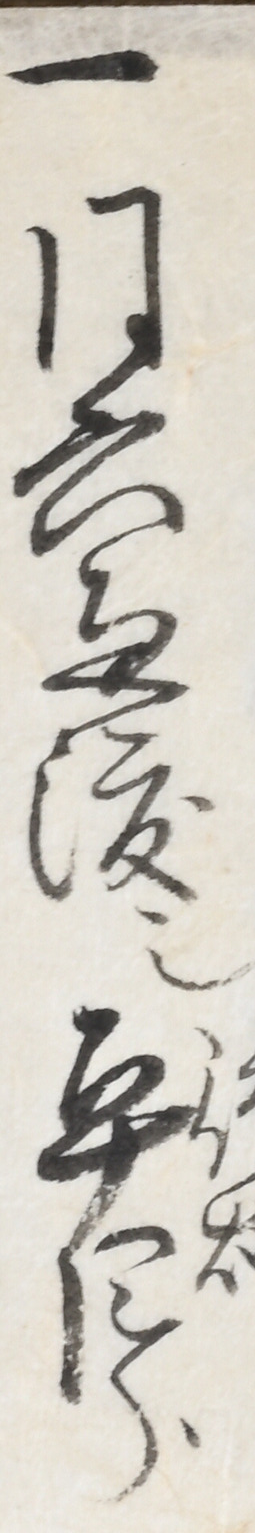一同六両渡し平四郎
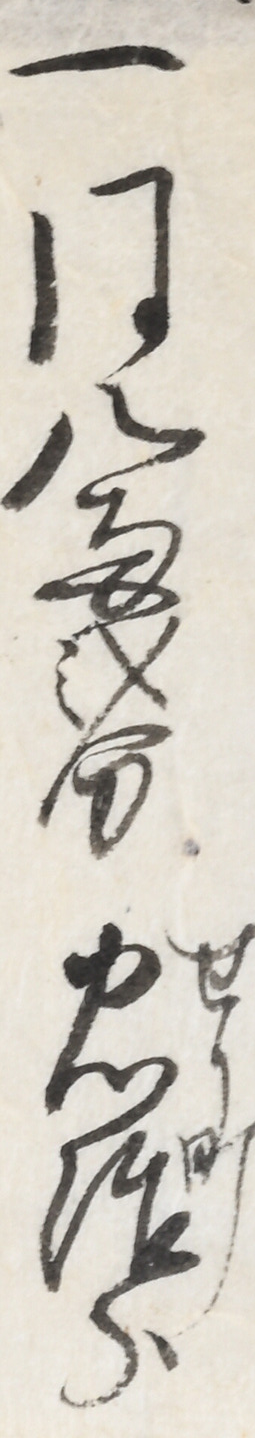一同八両弐分忠治郎
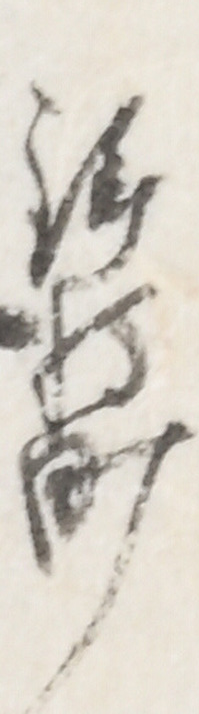鉾持町
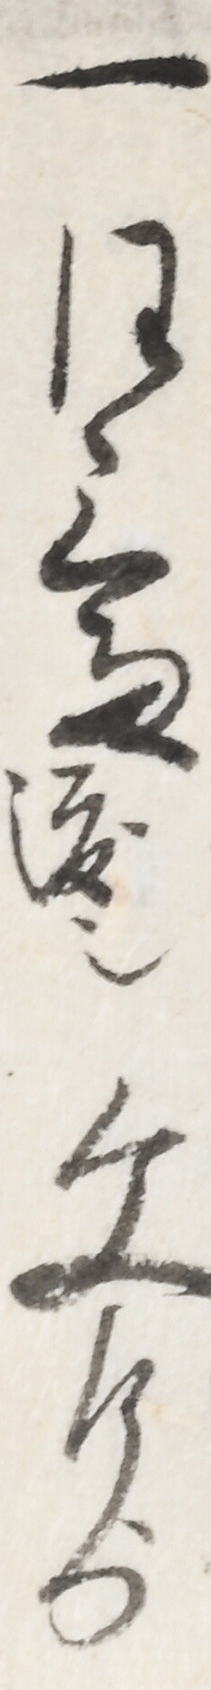一同三両渡し文左衛門
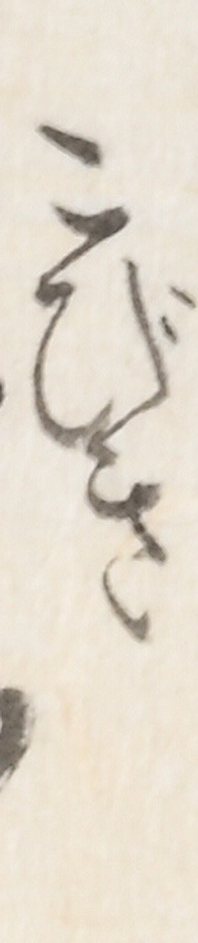こびき
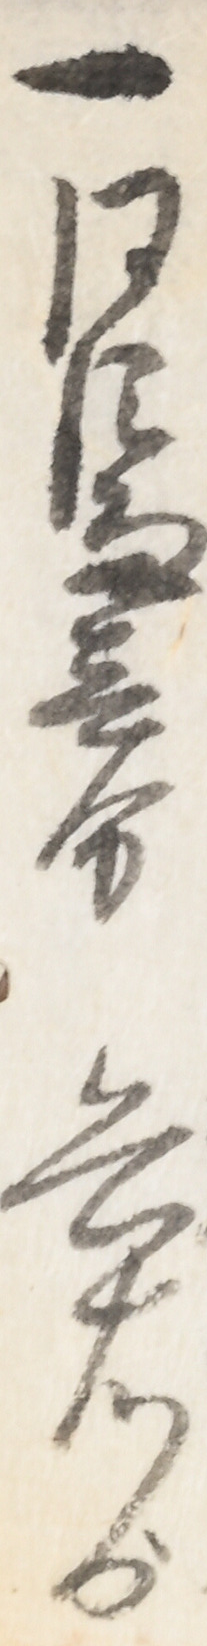一同四両壱分兵右衛門
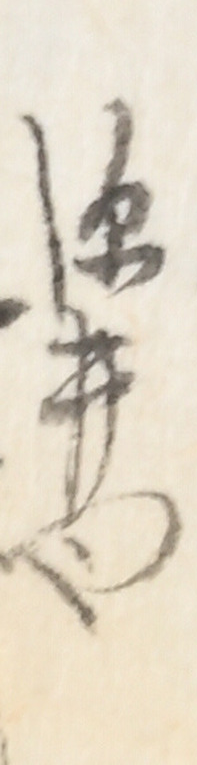深井や
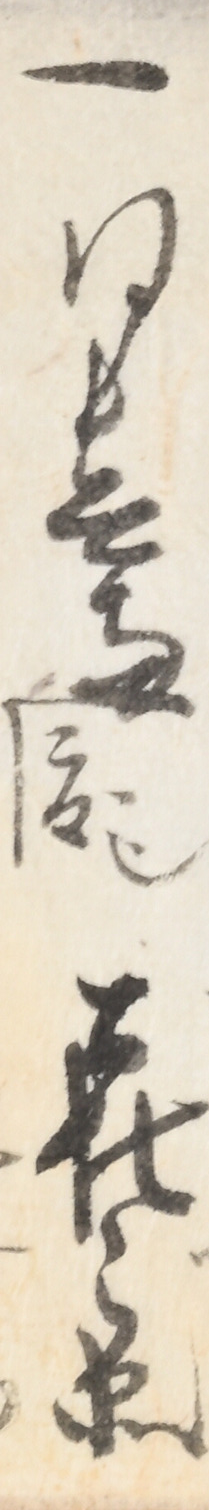一同壱両渡し喜兵衛
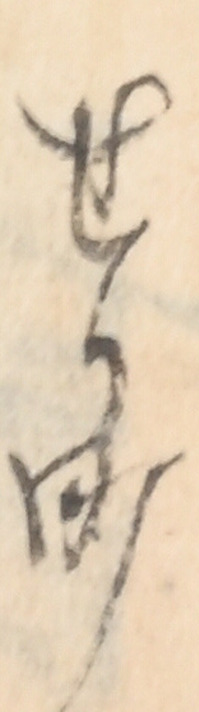せり町

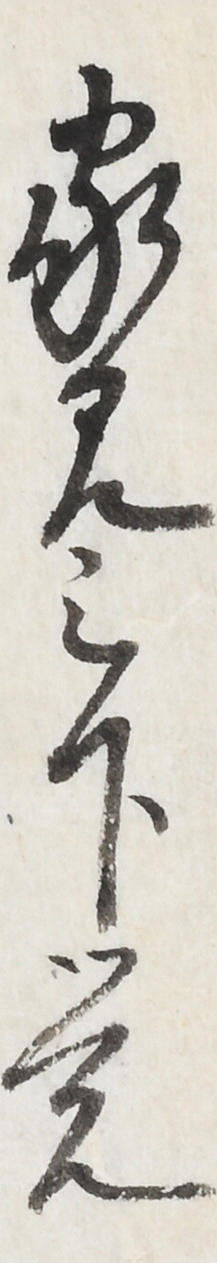家見之下覚
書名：合力覚帳
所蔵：伊那市立高遠町図書館・合同会社AMANE
